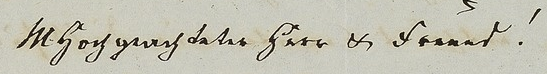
MHochgeachteter Herr & Freund!
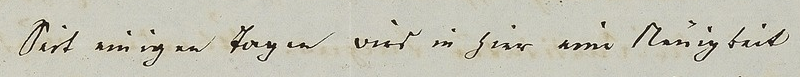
Seit einigen Tagen wird in hier eine Neuigkeit
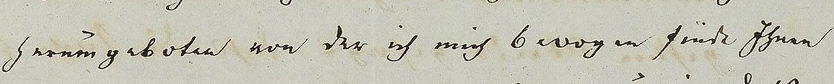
herumgeboten von der ich mich bewogen finde Ihnen
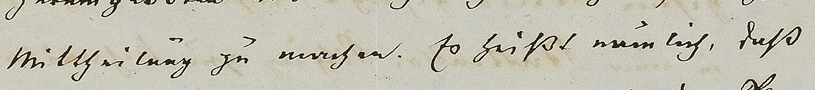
Mittheilung zu machen. Es heißt nämlich, daß
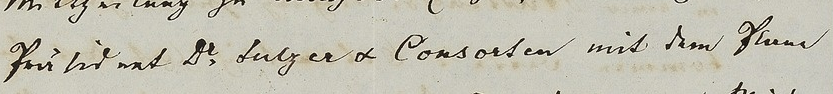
Präsident DrSulzer & Consorten mit dem Plane
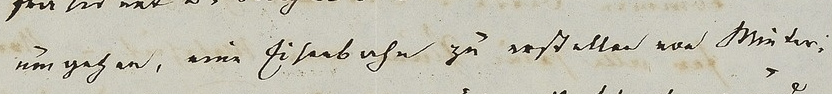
umgehen, eine Eisenbahn zu erstellen von Winter-
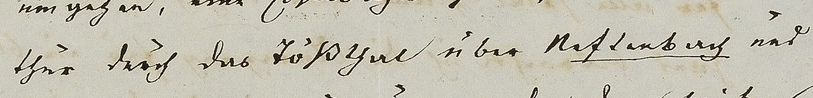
thur durch das Tößthal über Neftenbach und
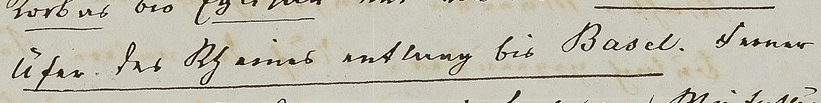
Ufer des Rheines entlang bis Basel. Ferner
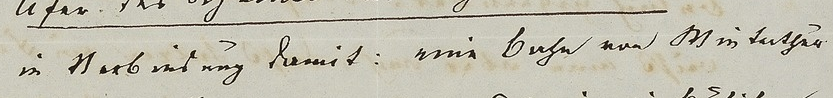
in Verbindung damit: eine Bahn von Winterthur
